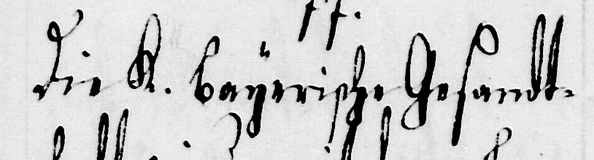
Demselben wieder eine
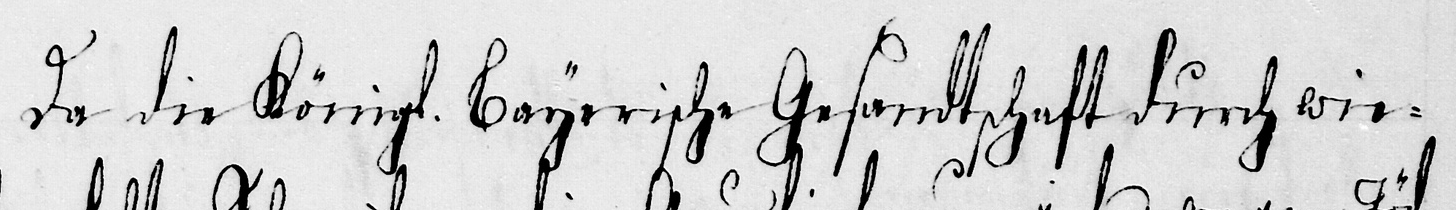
Da die Königl. Bayerische Gesandtschaft durch wie¬
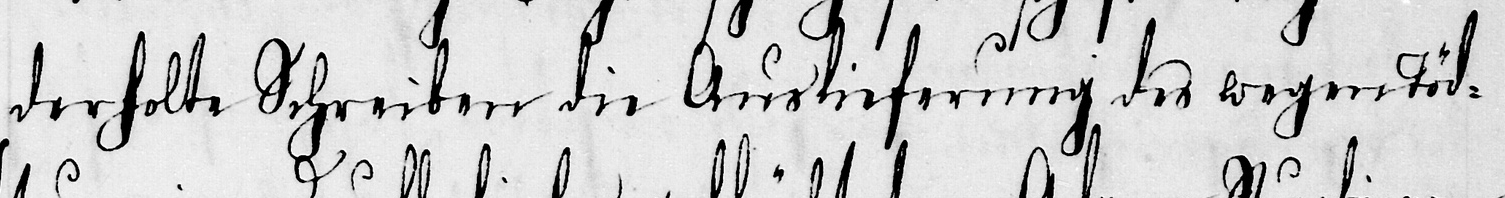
derholte Schreiben die Auslieferung des wegen Töd¬
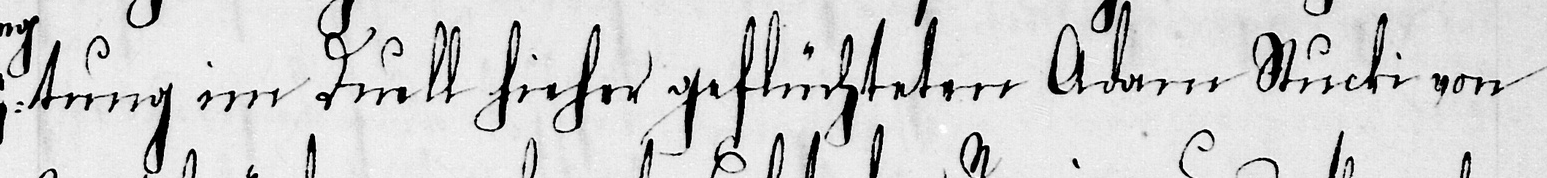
tung im Duell hieher geflüchteten Adam Stucki von
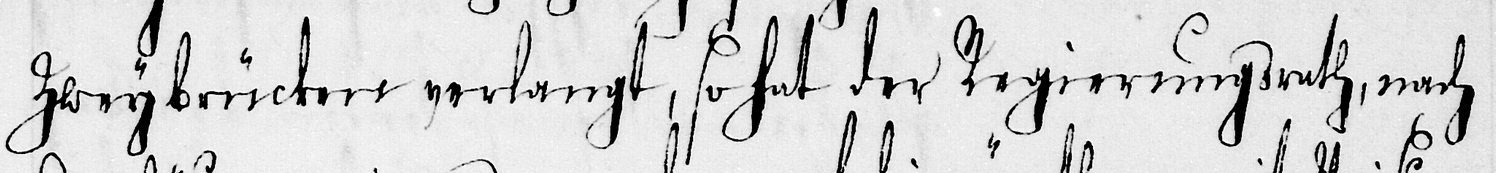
Zweybrücken verlangt, so hat der Regierungsrath, nach
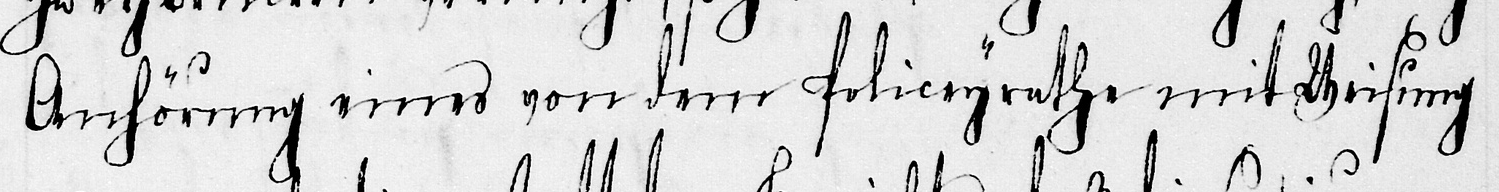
Anhörung eines von dem Policeyrathe mit Weisung
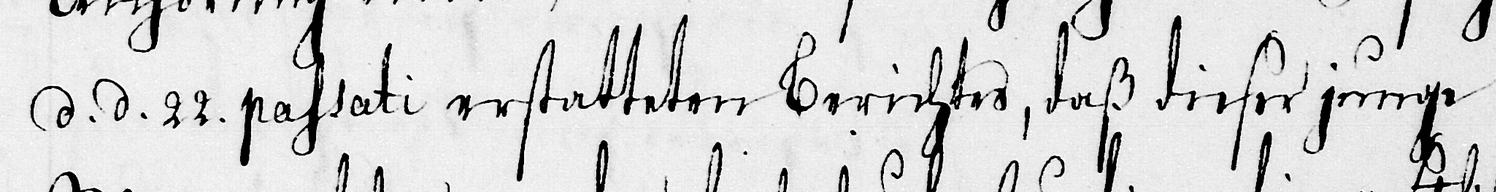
d. d. 22. passati erstatteten Berichtes, daß dieser junge
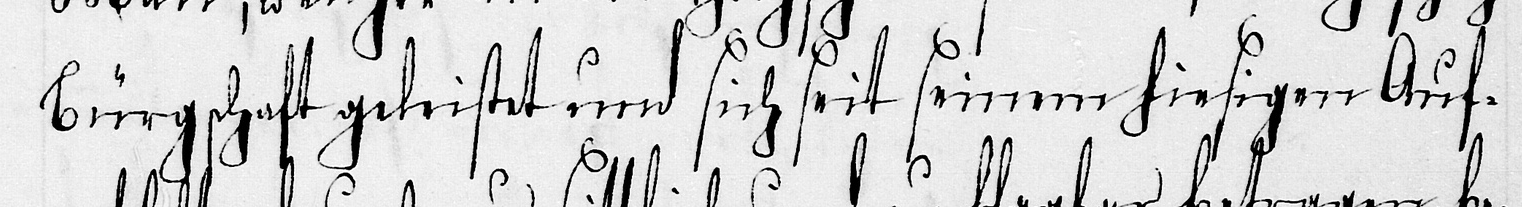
Bürgschaft geleistet und sich seit seinem hiesigen Auf¬
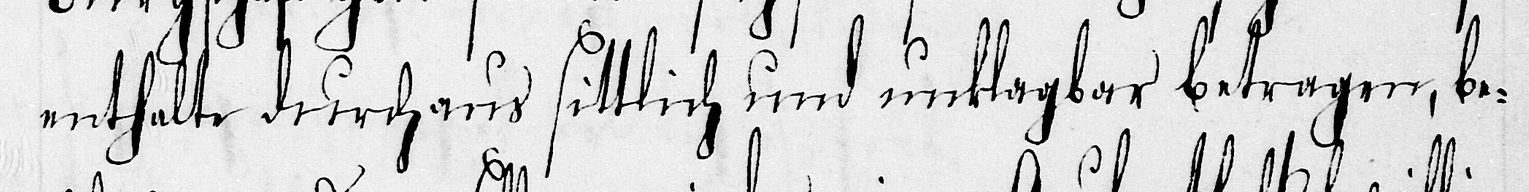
enthalte durchaus sittlich und unklagbar betragen, be¬
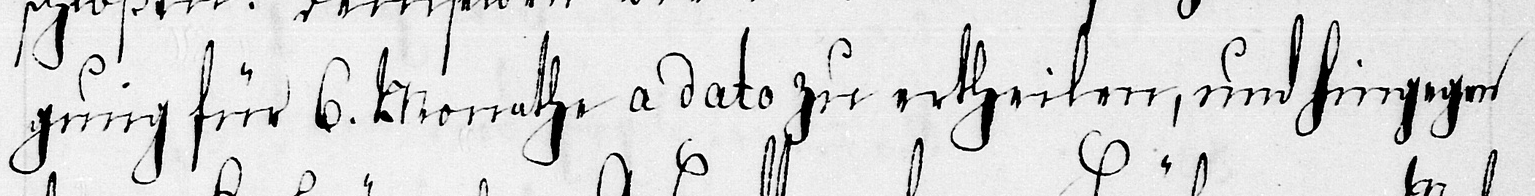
gung für 6. Monathe a dato zu ertheilen und hingegen
